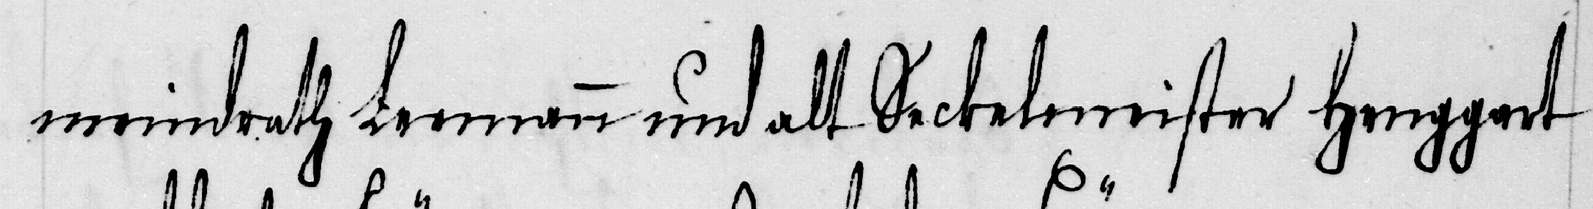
meindrath Leemann und alt Seckelmeister Henggart
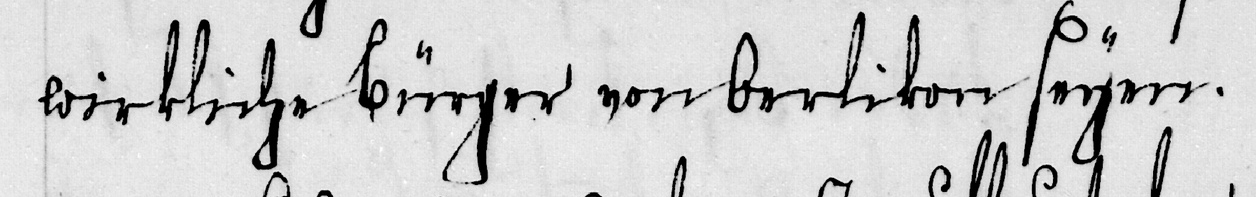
wirkliche Bürger von Oerlikon seyen.
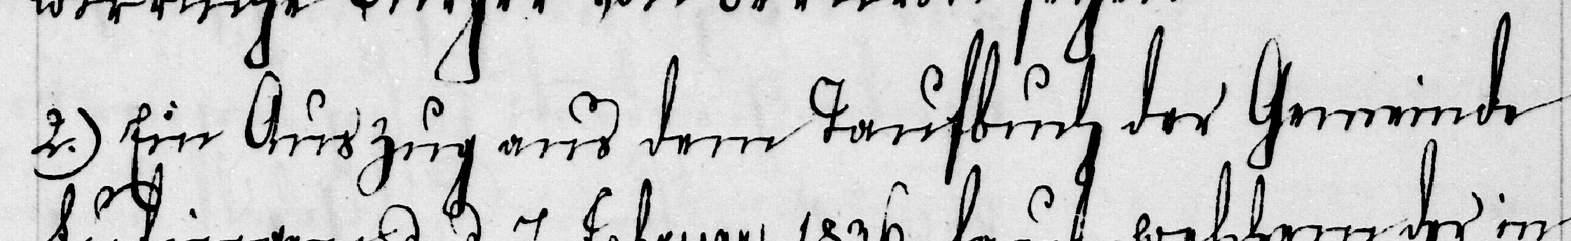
2.) Ein Auszug aus dem Taufbuch der Gemeinde
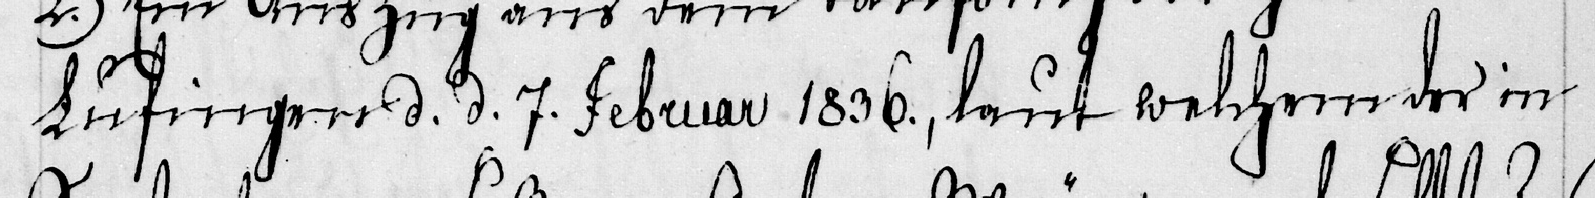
Lufingen d. d. 7. Februar 1836., laut welchem der in
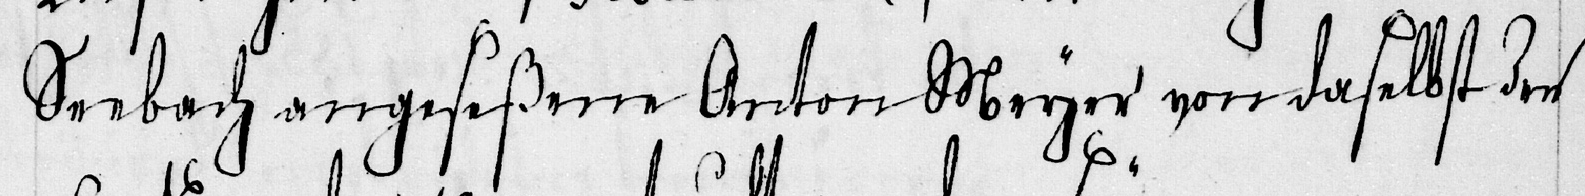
Seebach angeseßene Anton Meyer von daselbst den
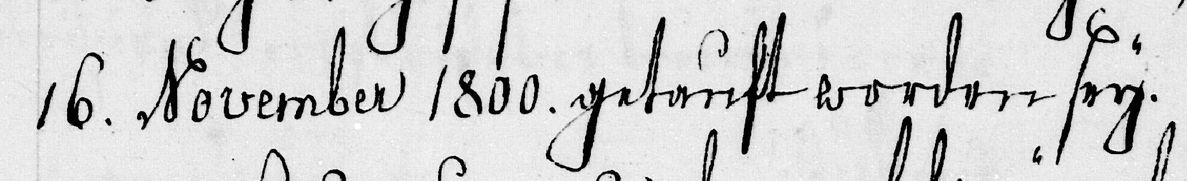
16. November 1800. getauft worden sey.
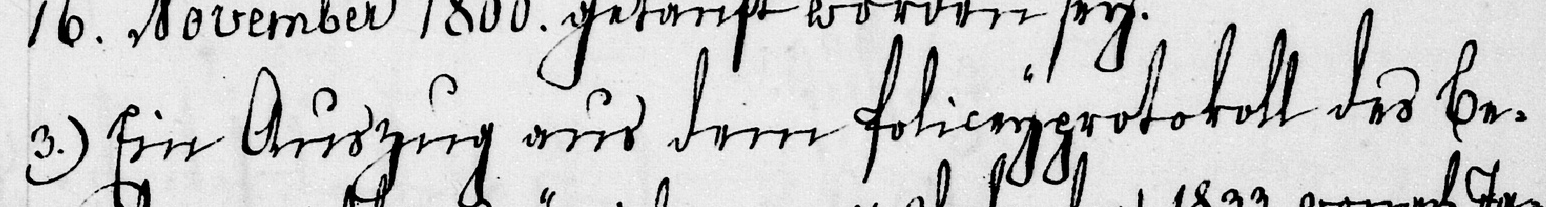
3.) Ein Auszug aus dem Policeyprotokoll des Be¬
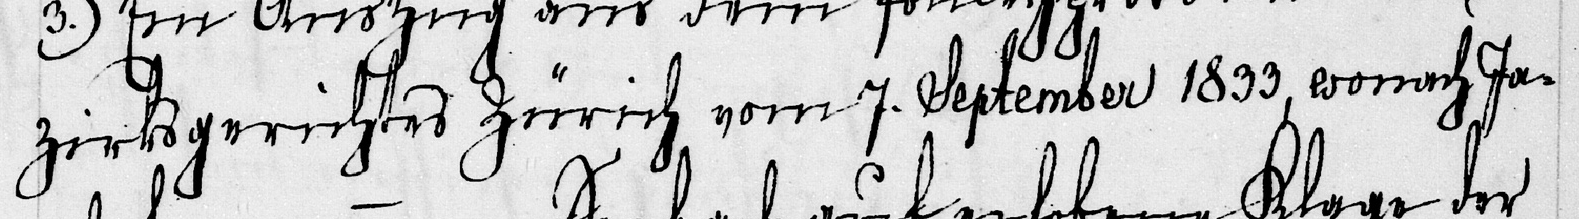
zirksgerichtes Zürich vom 7. September 1833, wonach Ja¬
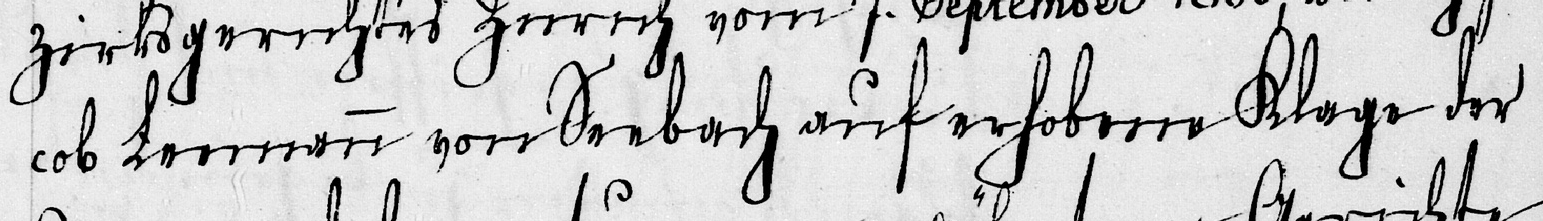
cob Leemann von Seebach auf erhobene Klage der
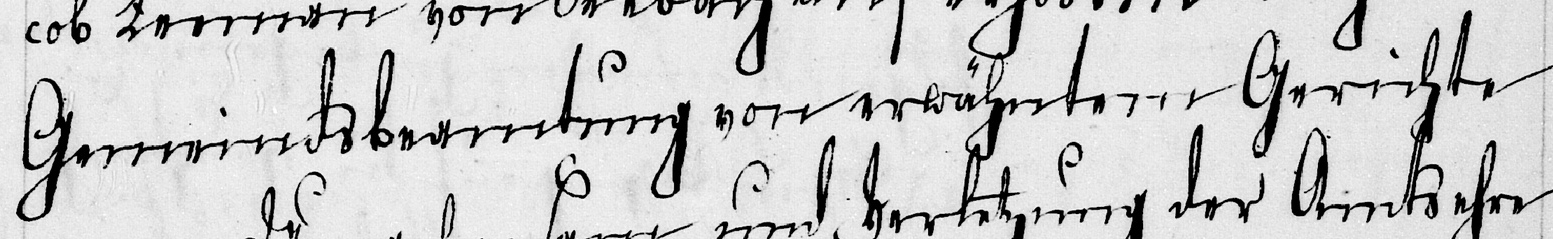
Gemeindsbeamtung von erwähntem Gerichte
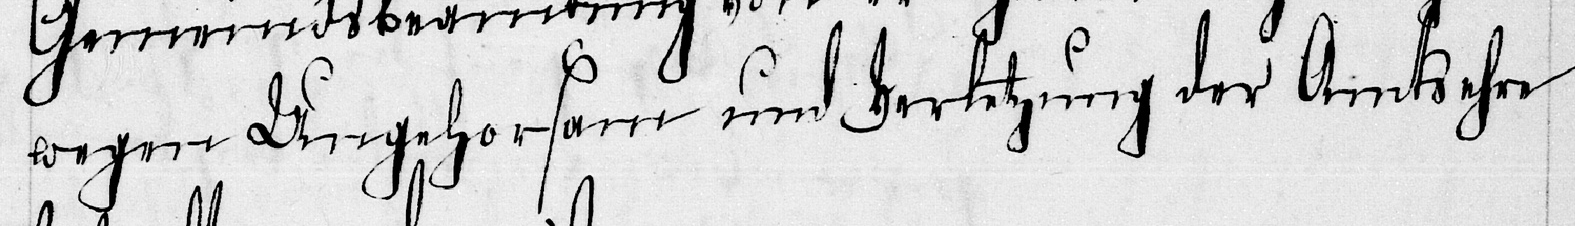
wegen Ungehorsam und Verletzung der Amtsehre
